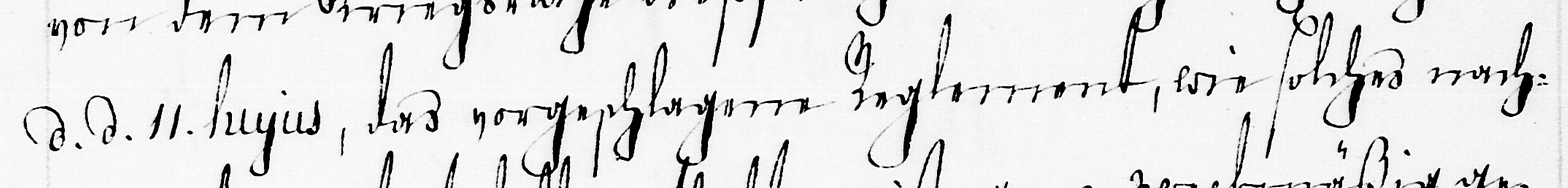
d. d. 11. hujus, das vorgeschlagene Reglement, wie solches nach¬
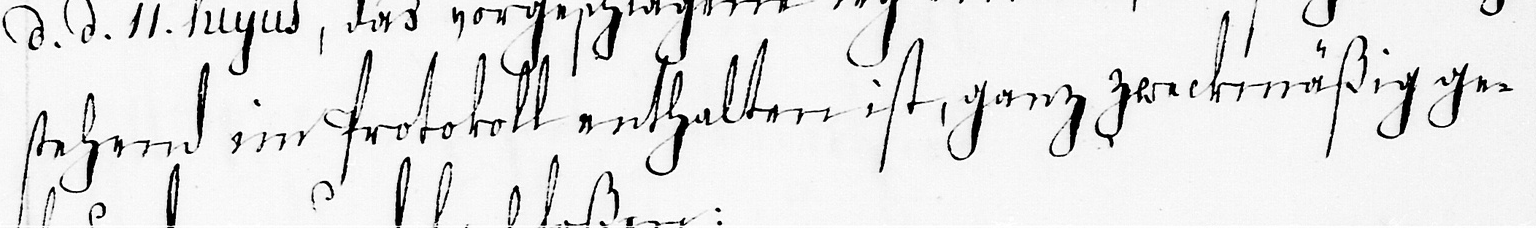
stehend im Protokoll enthalten ist, ganz zweckmäßig ge¬
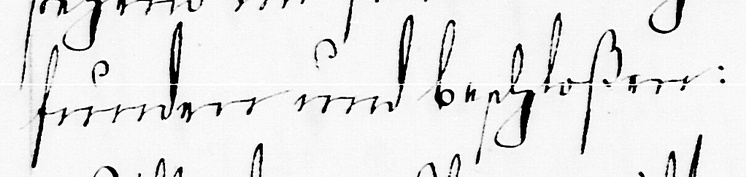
funden und beschloßen:
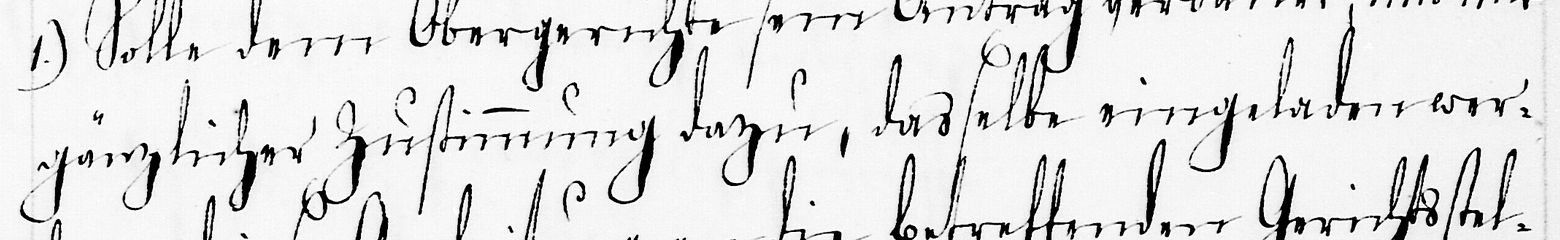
gänzlicher Zustimmung dazu, dasselbe eingeladen wer¬
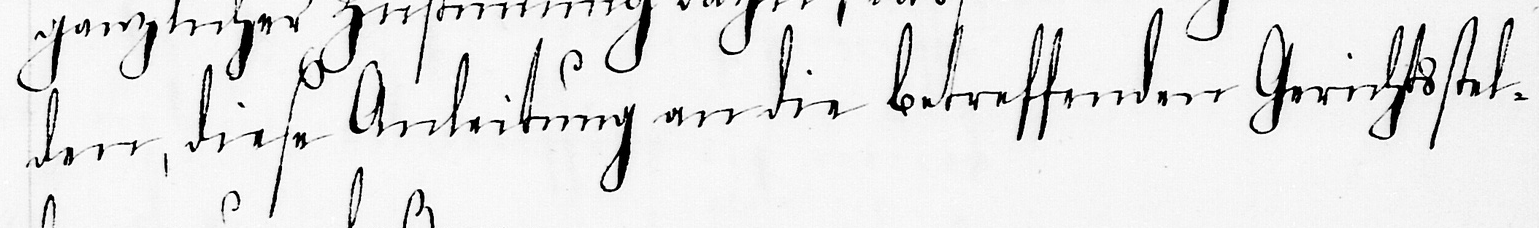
den, diese Anleitung an die betreffenden Gerichtsst¬
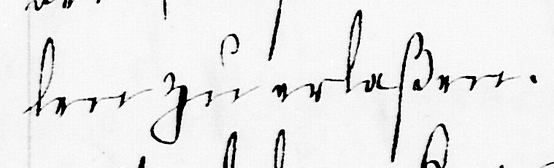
len zu erlaßen.
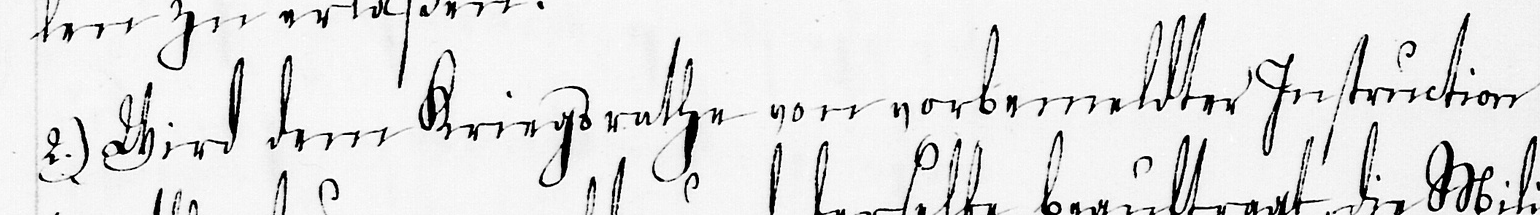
2.) Wird dem Kriegsrathe von vorbemeldter Instruction
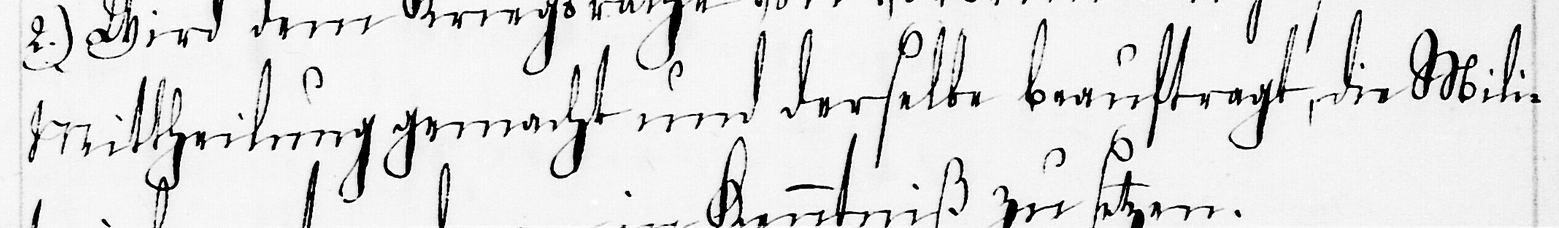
Mittheilung gemacht und derselbe beauftragt, die Mili¬
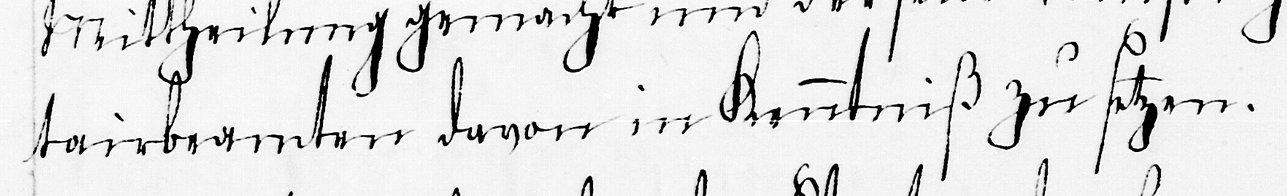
tairbeamten davon in Kenntniß zu setzen.
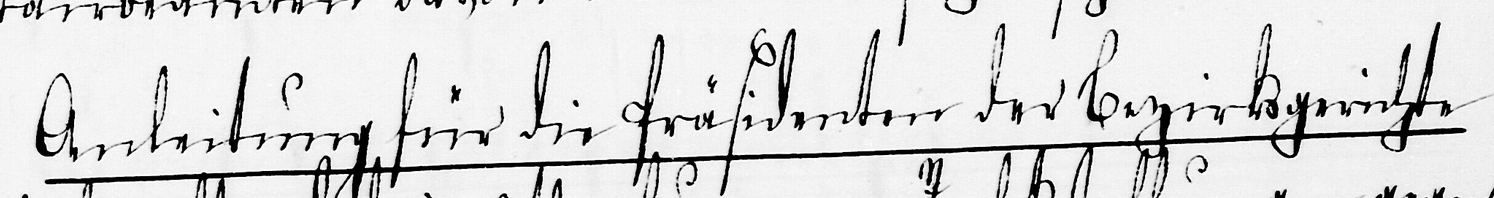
Anleitung für die Präsidenten der Bezirksgerichte
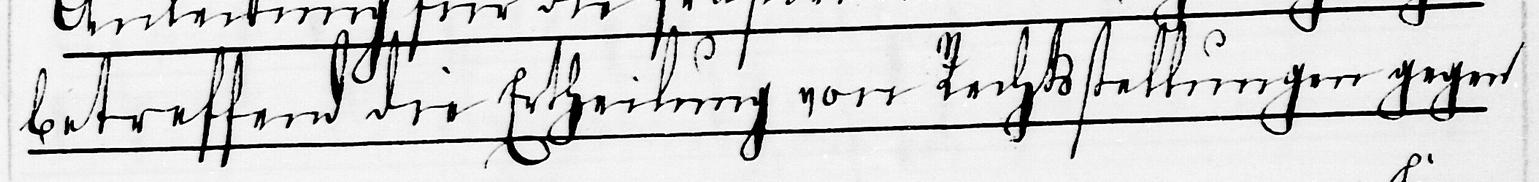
betreffend die Ertheilung von Rechtsstellungen gegen
